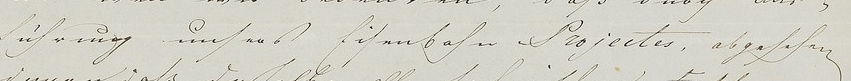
führung unsers Eisenbahn Projectes, abgesehen
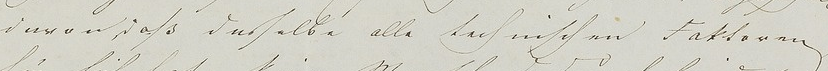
davon, daß dasselbe alle technischen Faktoren
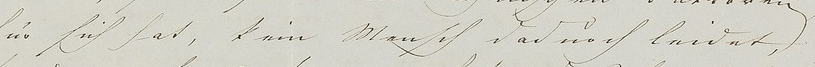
für sich hat, kein Mensch dadurch leidet,
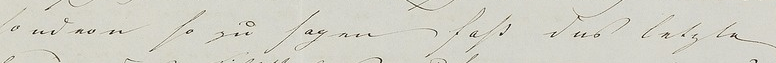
sondern so zu sagen fast das letzte
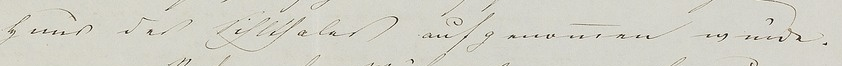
Haus des Sihlthales aufgenommen würde.
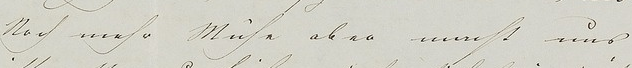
Noch mehr Mühe aber macht uns
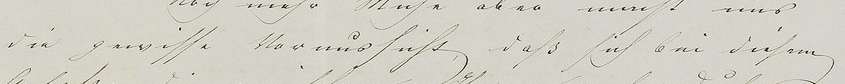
die gewisse Voraussicht, daß sich bei diesem
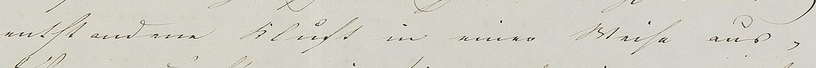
entstandene Kluft in einer Weise aus-
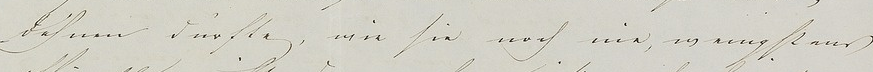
dehnen dürfte, wie sie noch nie, wenigstens
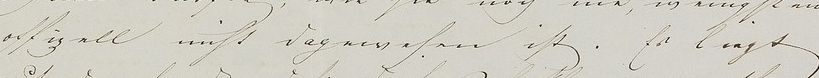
offiziell nicht dagewesen ist. Es liegt
